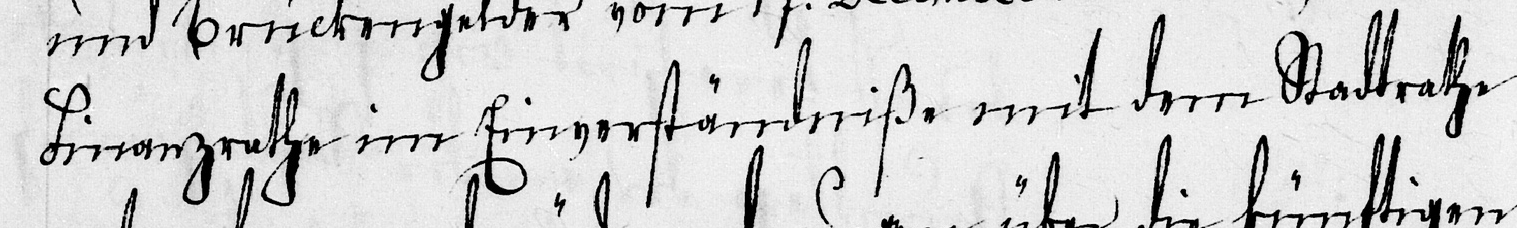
Finanzrathe im Einverständniße mit dem Stadtrathe
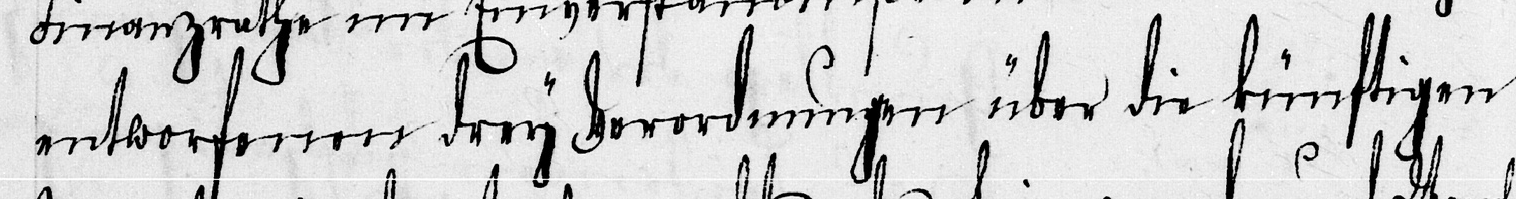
entworfenen drey Verordnungen über die künftigen
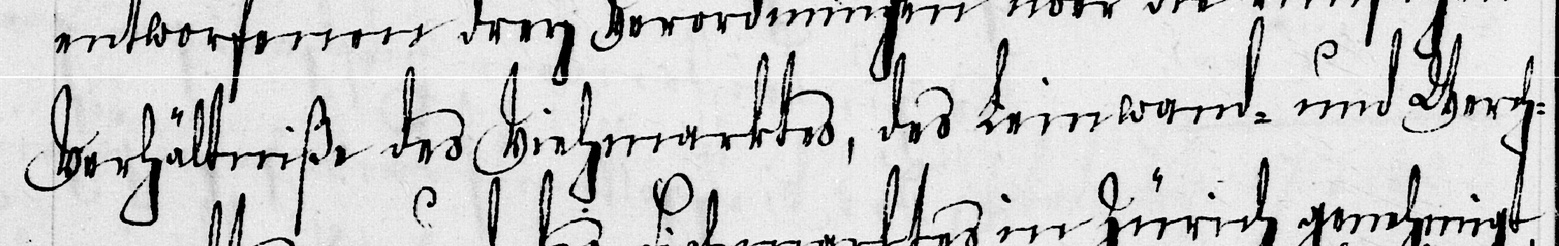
Verhältniße des Viehmarktes, des Leinwand- und Werch¬
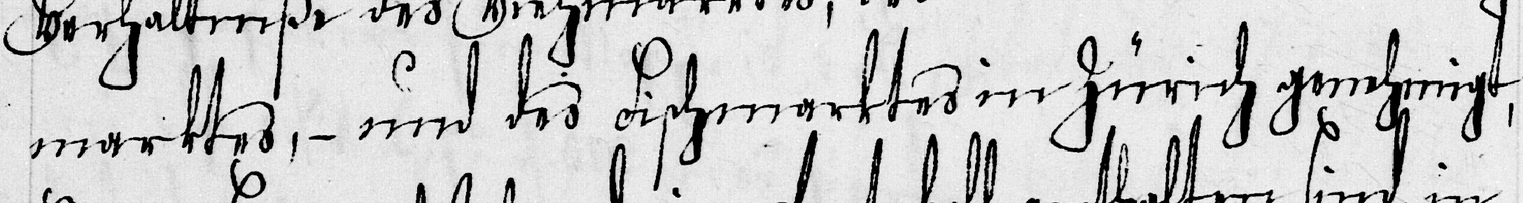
marktes,– und des Fischmarktes in Zürich genehmigt,
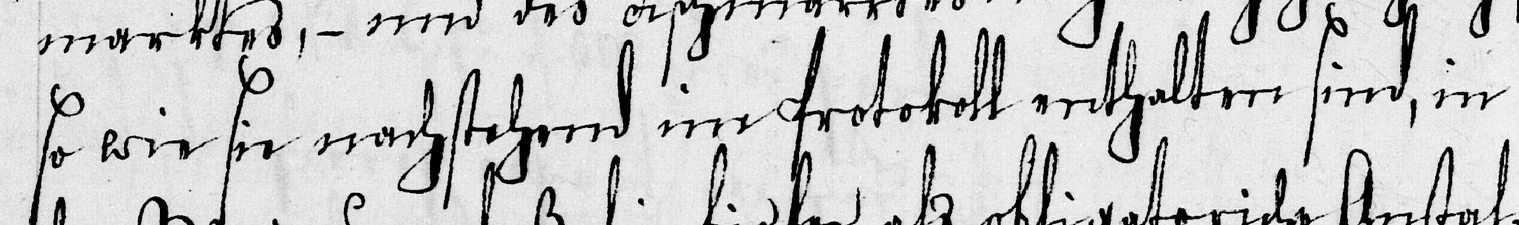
so wie sie nachstehend im Protokoll enthalten sind, in
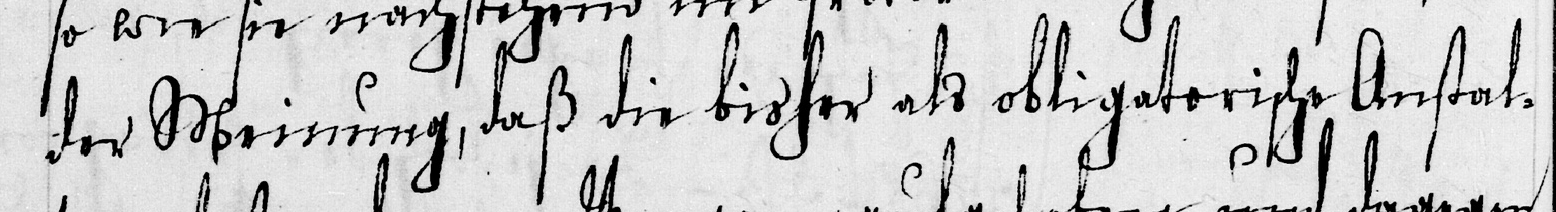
der Meinung, daß die bisher als obligatorische Anstal¬
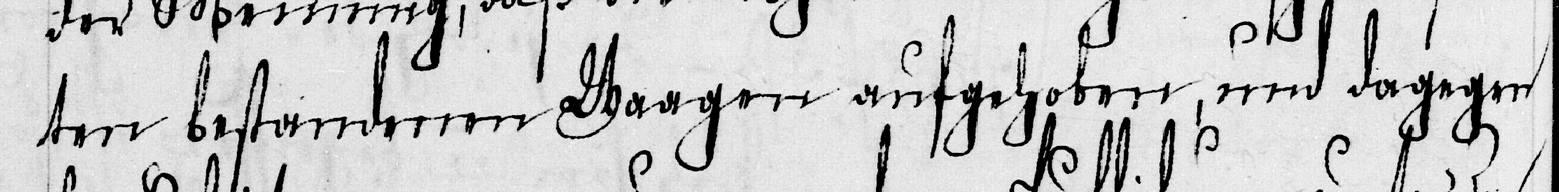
ten bestandenen Waagen aufgehoben, und dagegen
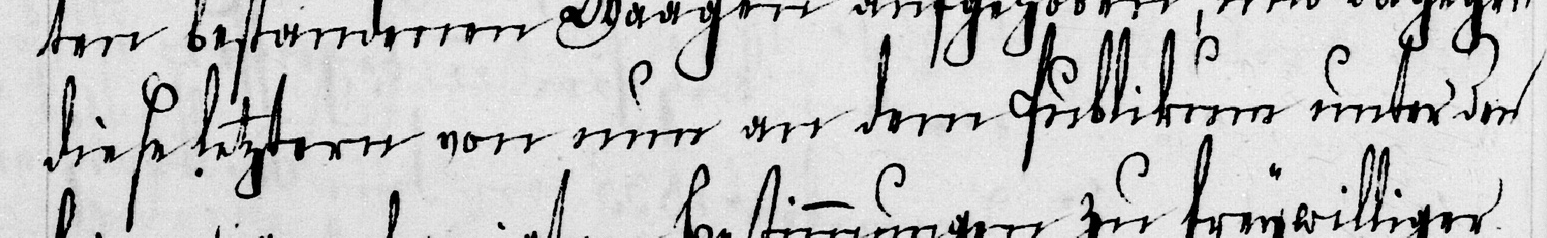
diese letztern von nun an dem Publikum unter der
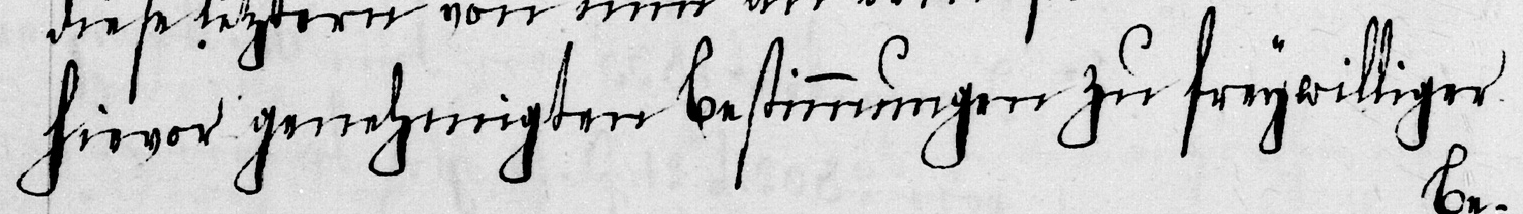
hievor genehmigten Bestimmungen zu freywilliger
